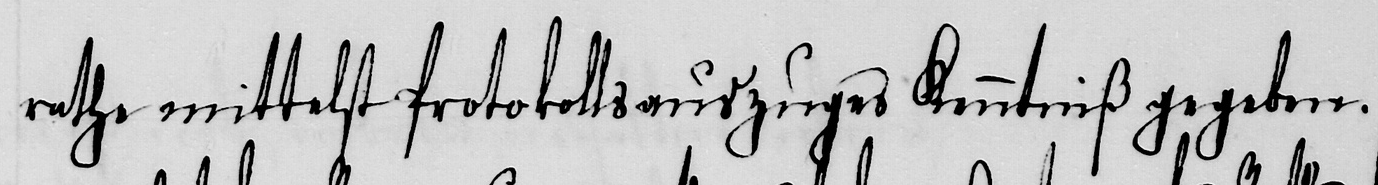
rathe mittelst Protokollsauszuges Kenntniß gegeben.
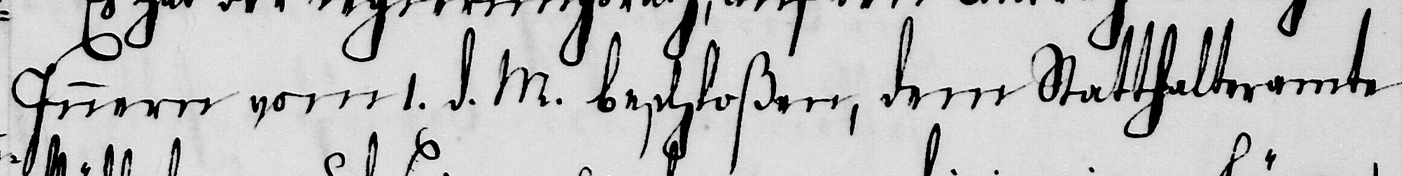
Innern vom 1. d. M. beschloßen, dem Statthalteramte
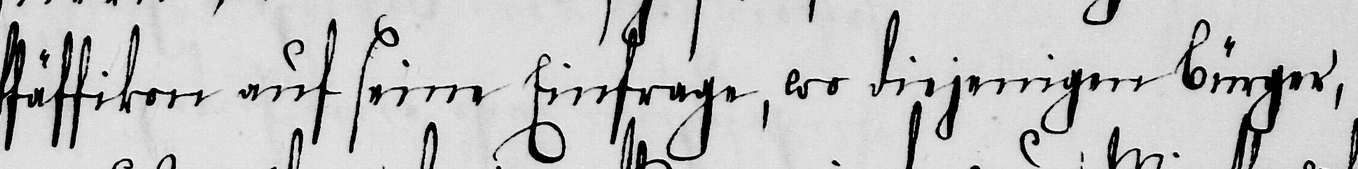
fäffikon auf seine Einfrage, wo diejenigen Bürger,
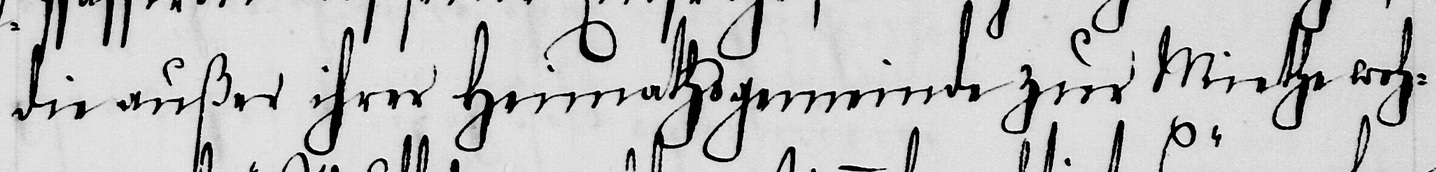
die außer ihrer Heimathsgemeinde zur Miethe woh¬
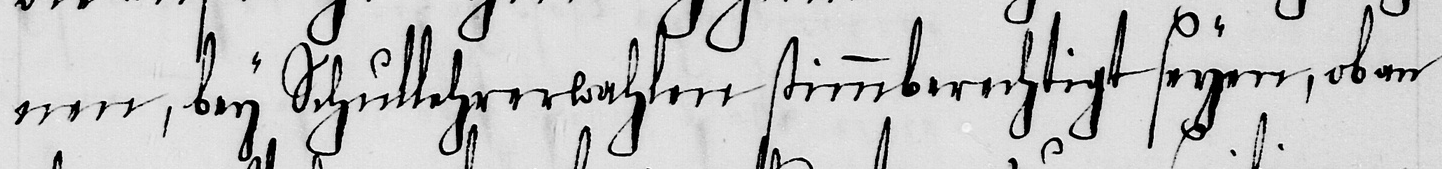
nen, bey Schullehrerwahlen stimmberechtigt seyen, ob an
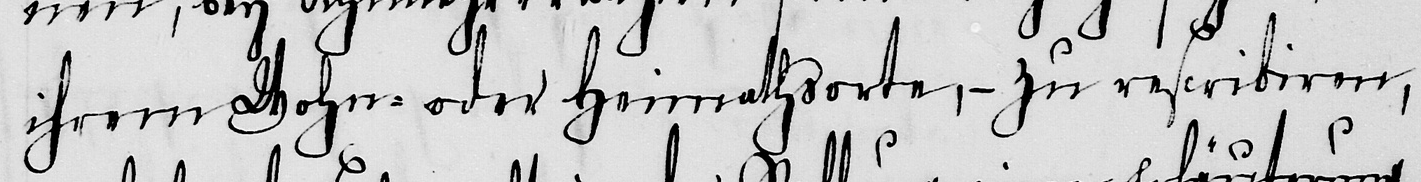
ihrem Wohn- oder Heimathsorten, – zu rescribiren,
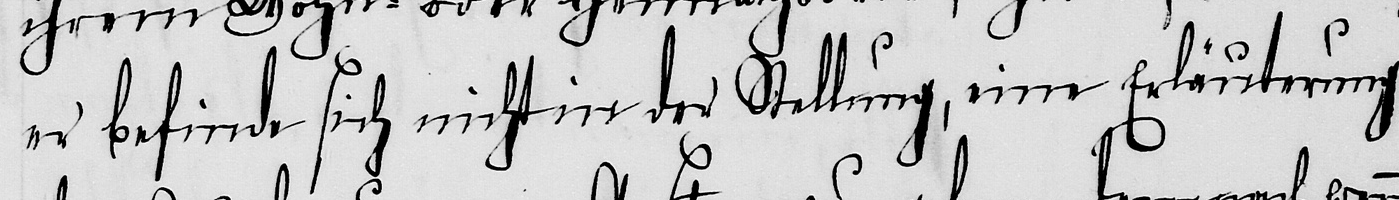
er befinde sich nicht in der Stellung, eine Erläuterung
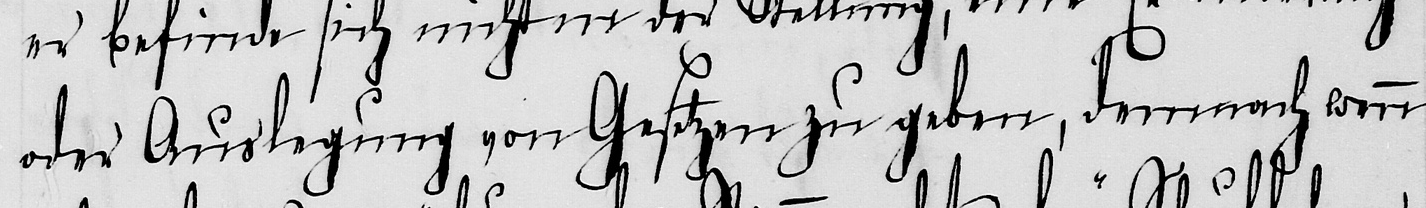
oder Auslegung von Gesetzen zu geben, demnach wenn
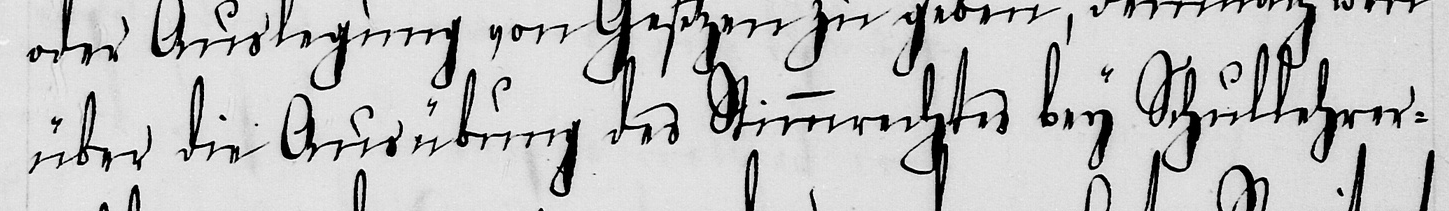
über die Ausübung des Stimmrechtes bey Schullehrer¬
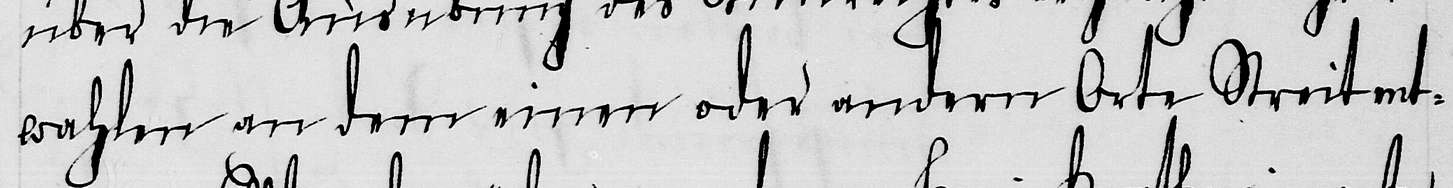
wahlen an dem einen oder andern Orte Streit ent¬
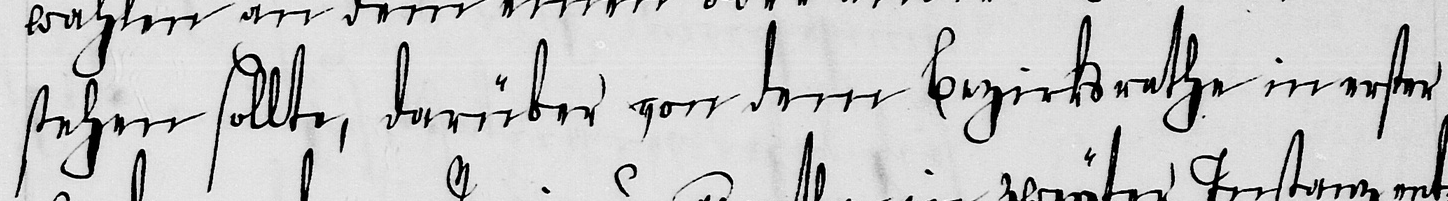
stehen sollte, darüber von dem Bezirksgerichte in erster
